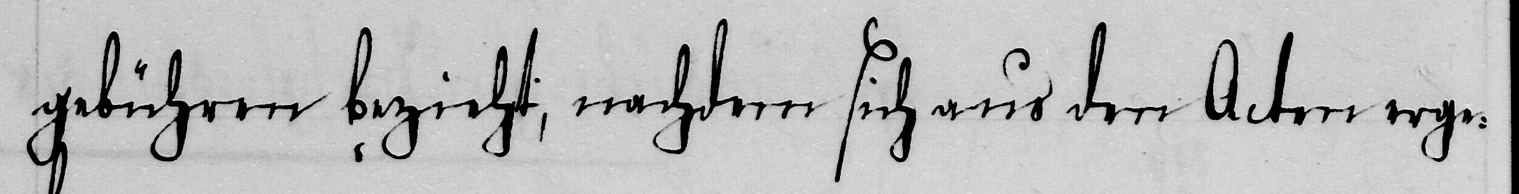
gebühren bezieht, nachdem sich aus den Acten erge¬
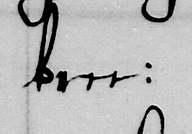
ben:
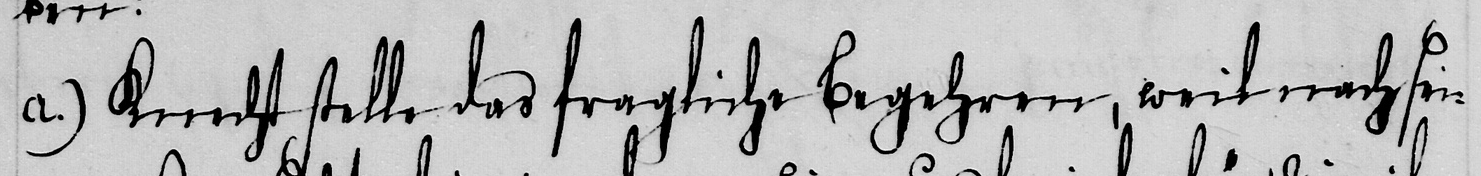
a.) Knecht stelle das fragliche Begehren, weil nach sei¬
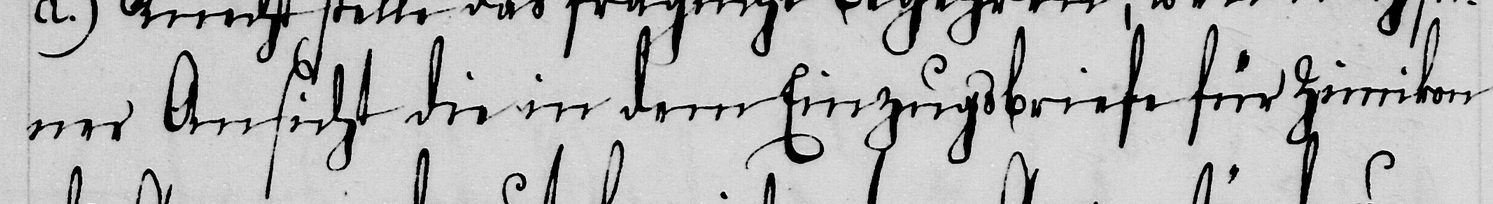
ner Ansicht die in dem Einzugsbriefe für Zimikon
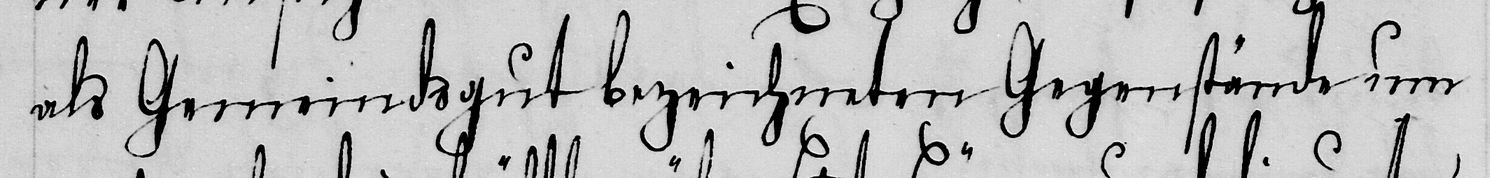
als Gemeindsgut bezeichneten Gegenstände um
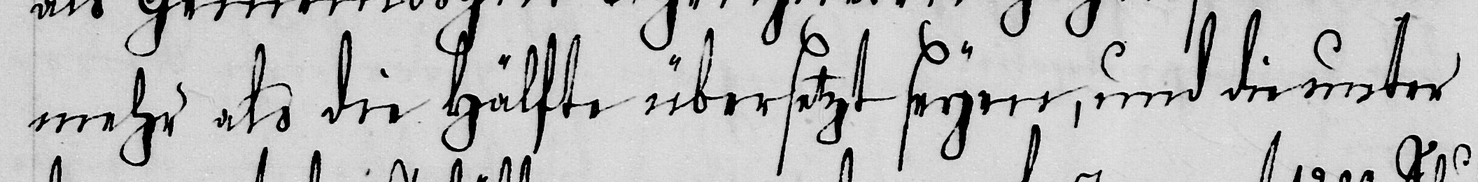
mehr als die Hälfte übersetzt seyen, und die unter
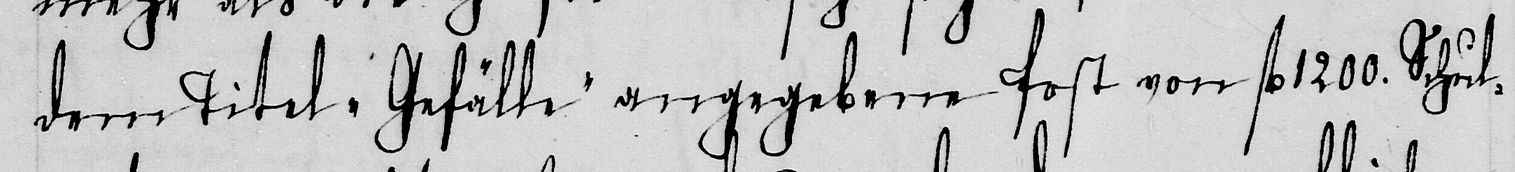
dem Titel „Gefälle“ angegebene Post von fl. 1200. Schu¬
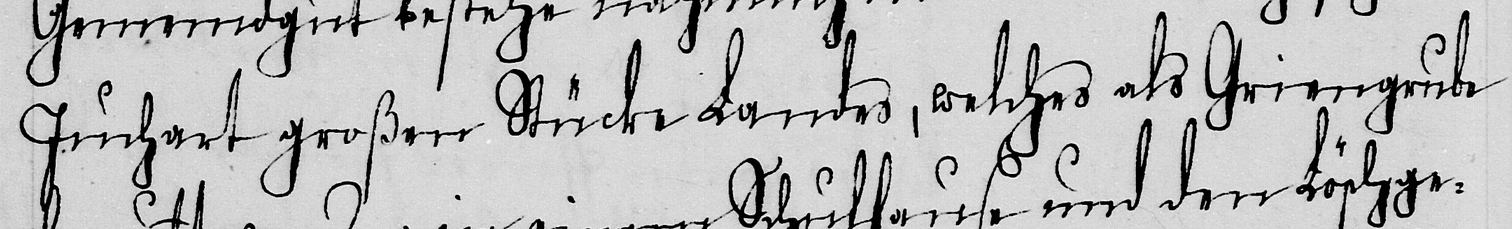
Juchart großen Stücke Landes, welches als Griengrube
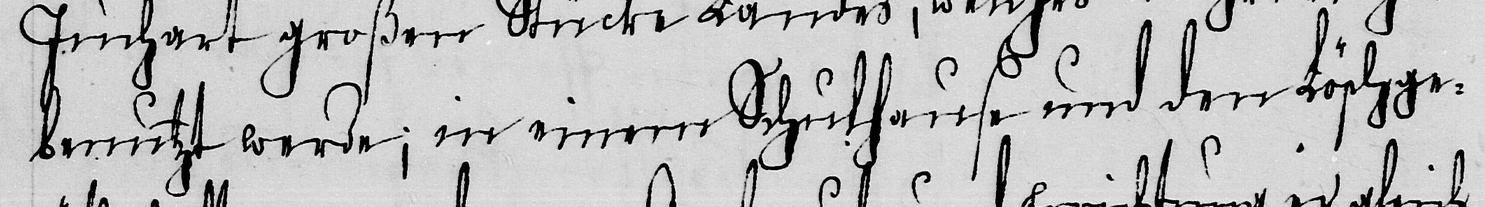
benutzt werde; in einem Schulhause und den Löschge¬
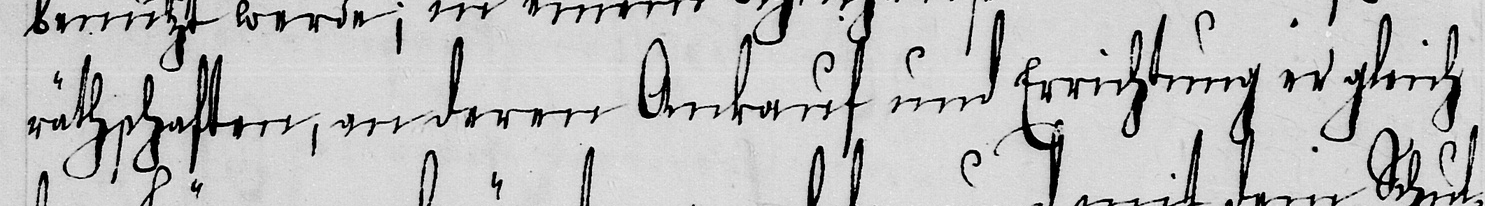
räthschaften, an deren Ankauf und Errichtung er gleich
